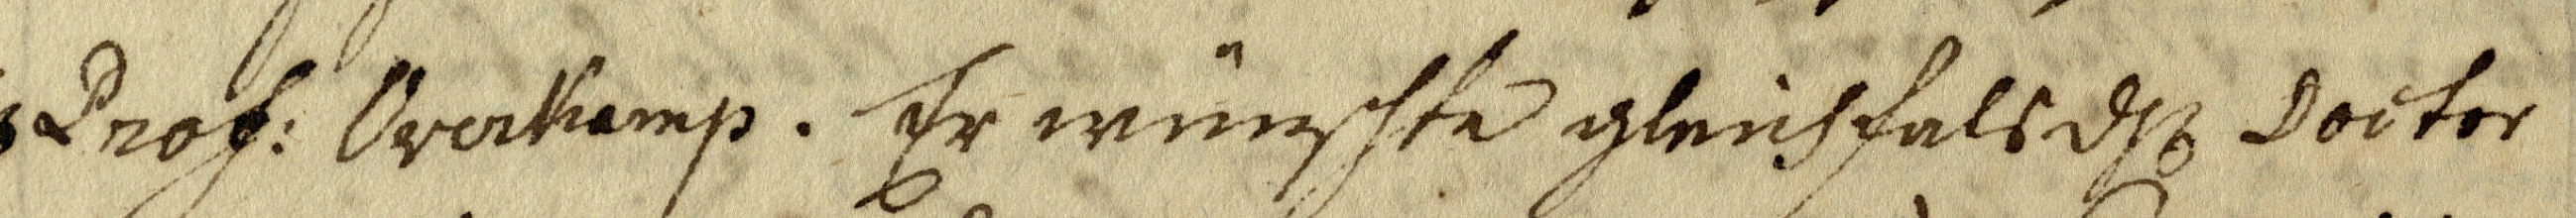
dh Prof. Overkamp. Er wünschte gleichfals, dh Doctor
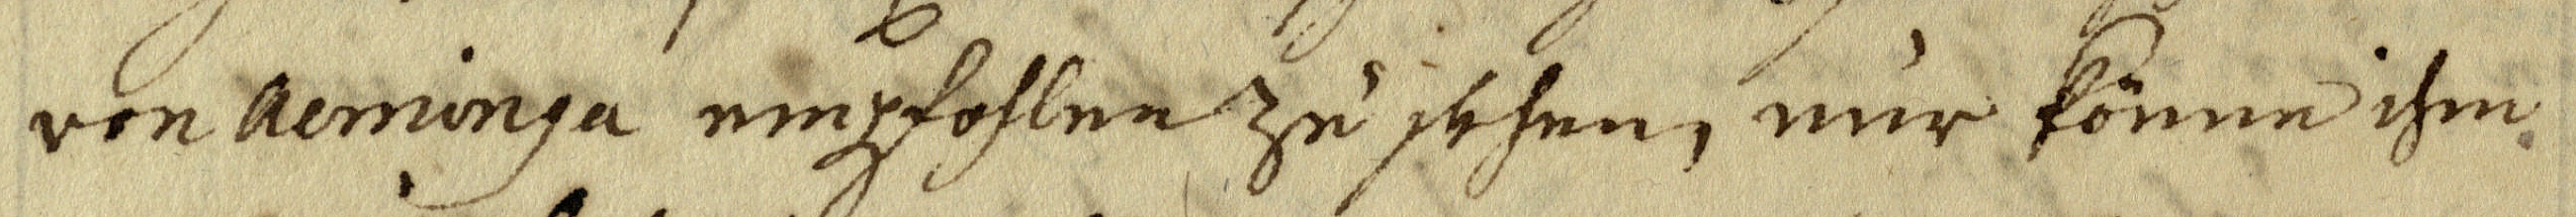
von Aeminga empfohlen zu sehen, nur könne ihm
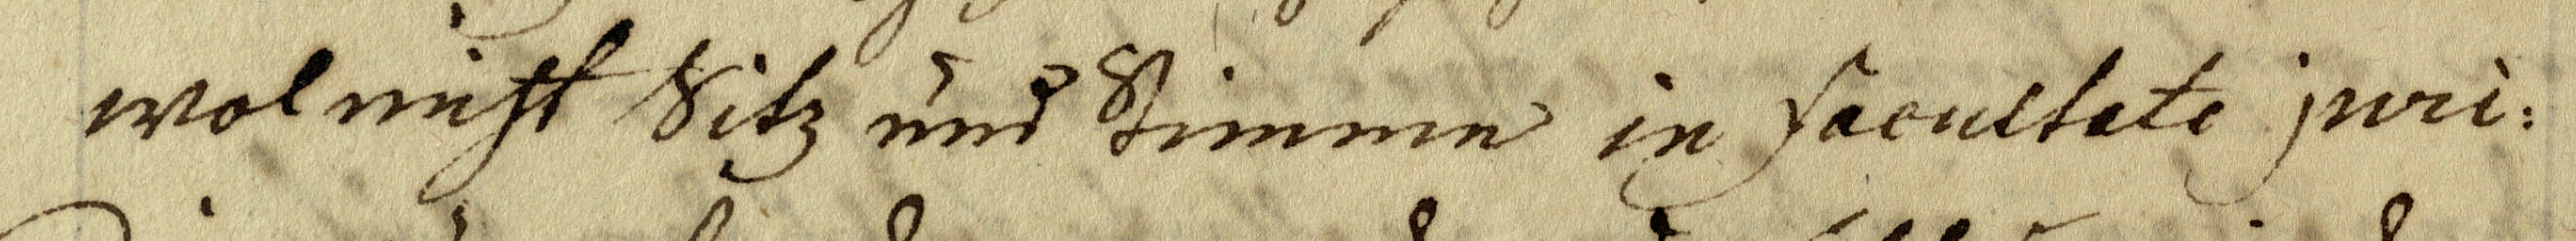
wol nicht Sitz und Stimme in Facultate juri¬
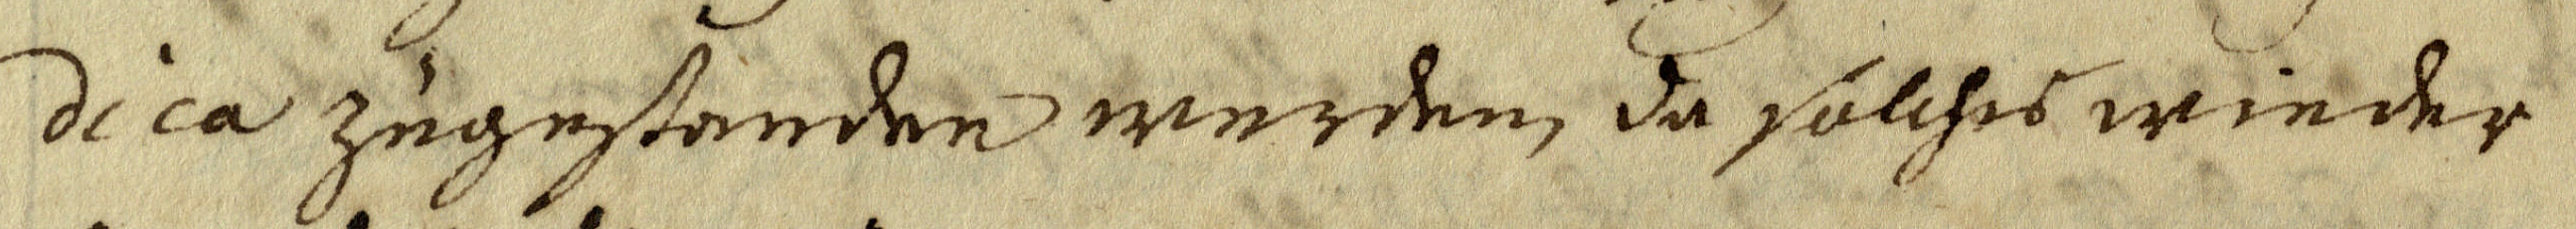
dica zugestanden werden, da solches wieder
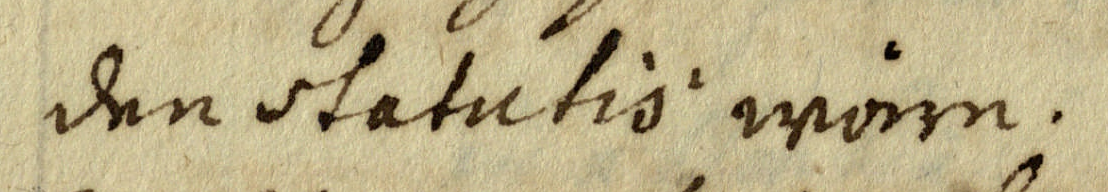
den statutis wäre.
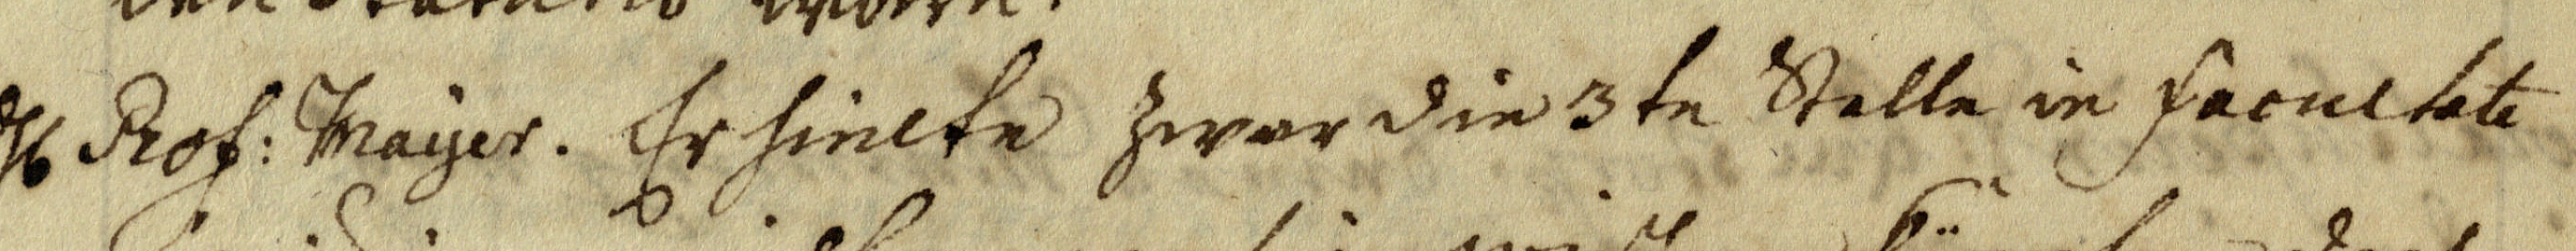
dh Prof. Maÿer. Er hielte zwar die 3 te Stelle in Facultate
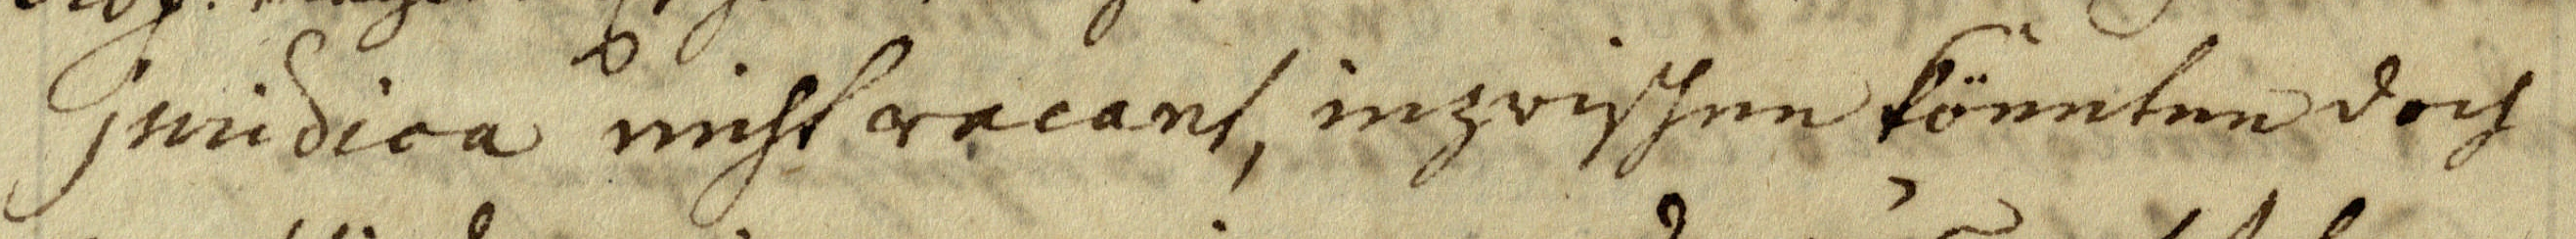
juridica nicht vacant, inzwischen könnten doch
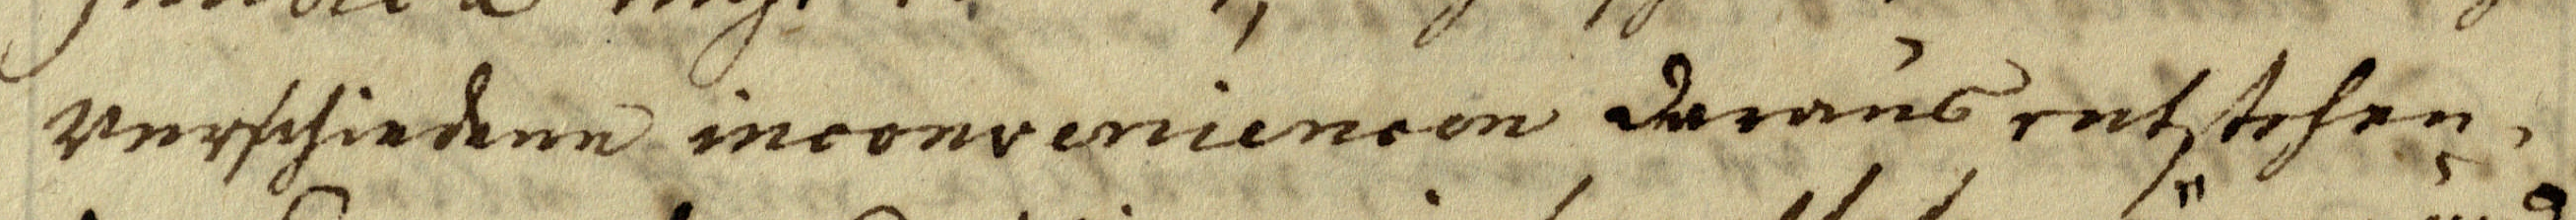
verschiedene inconveniencen daraus entstehen,
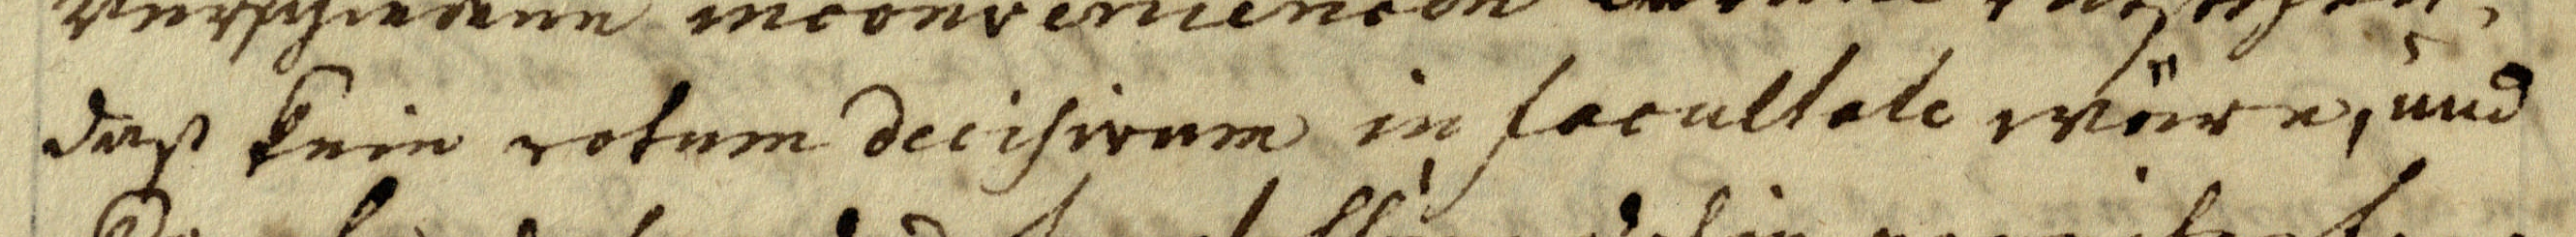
daß kein votum decisivum in Facultate wäre, und
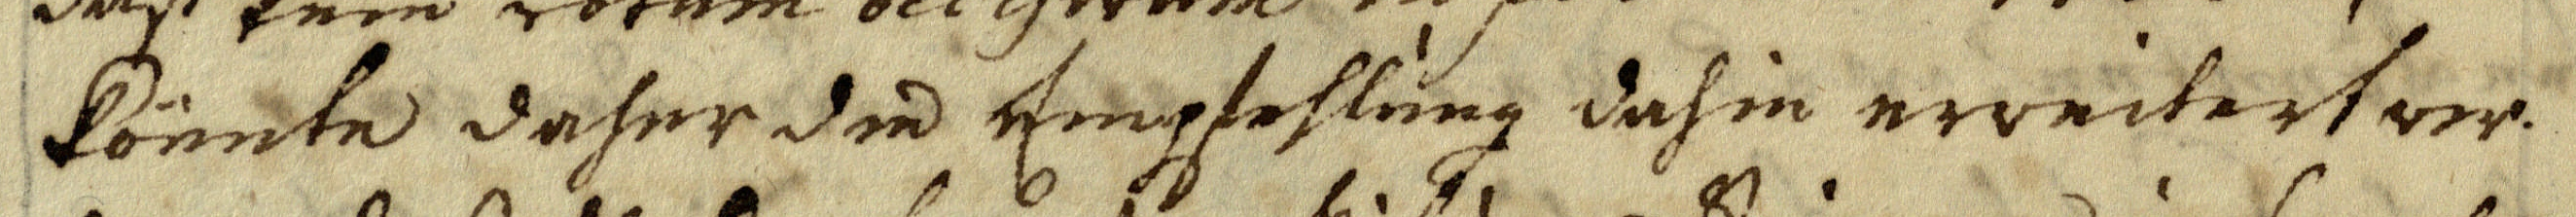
könnte daher die Empfehlung dahin erweitert wer¬
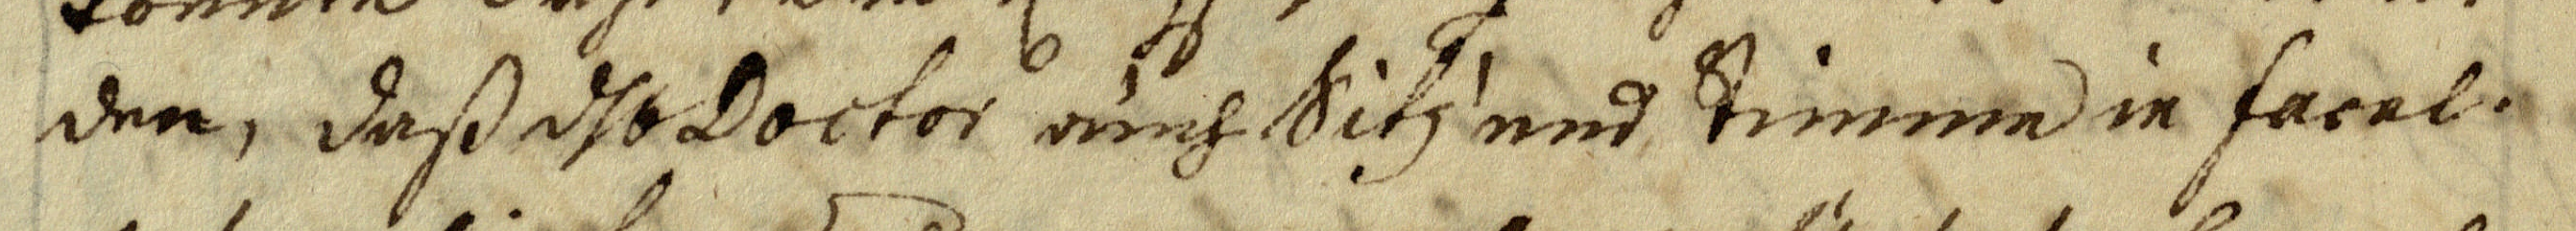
den, daß dh Doctor auch Sitz und Stimme in Facul¬
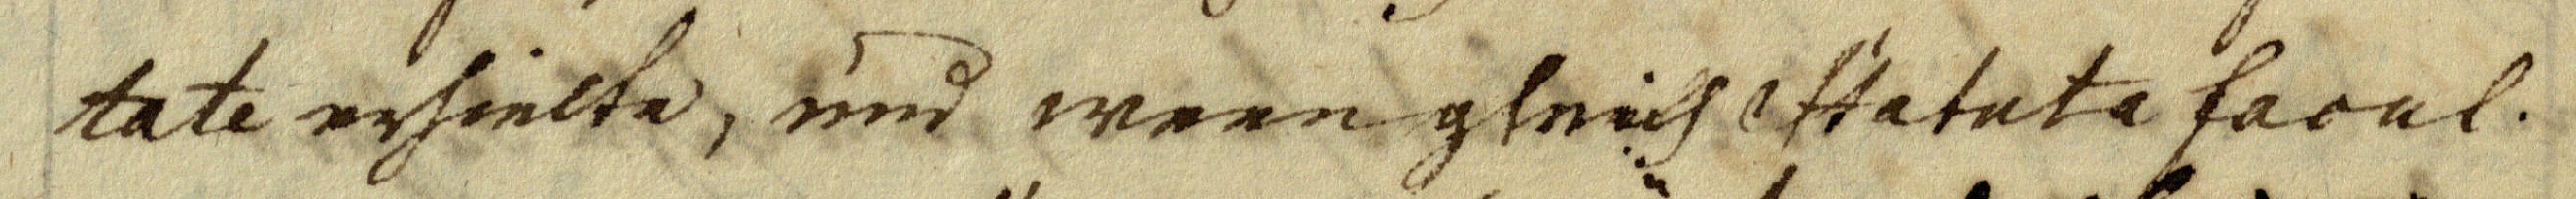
tate erhielte, und wenngleich Statuta facul¬
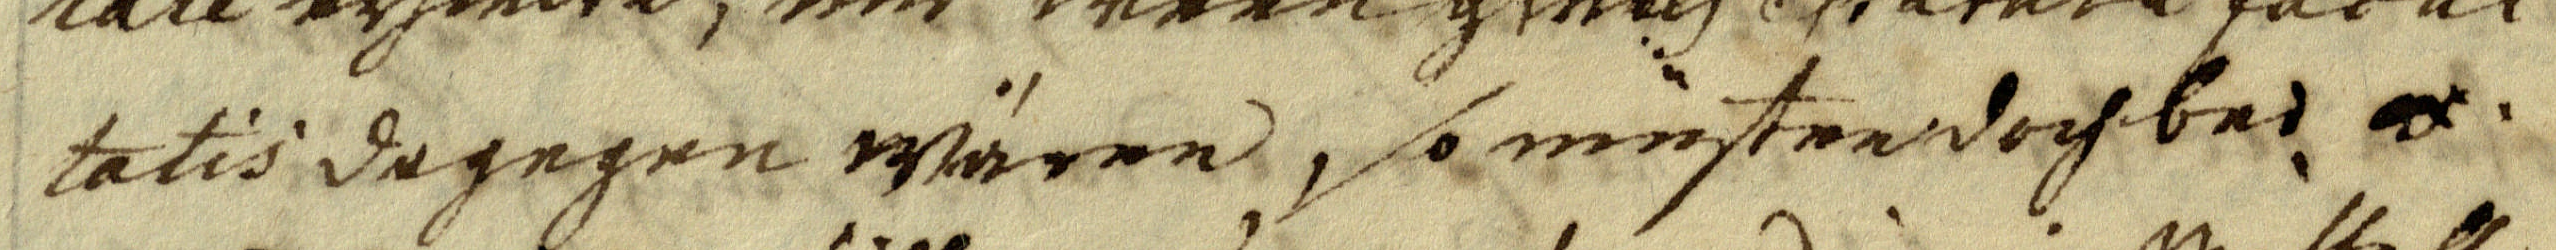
tatis dagegen wären, so müsten doch bei ex¬
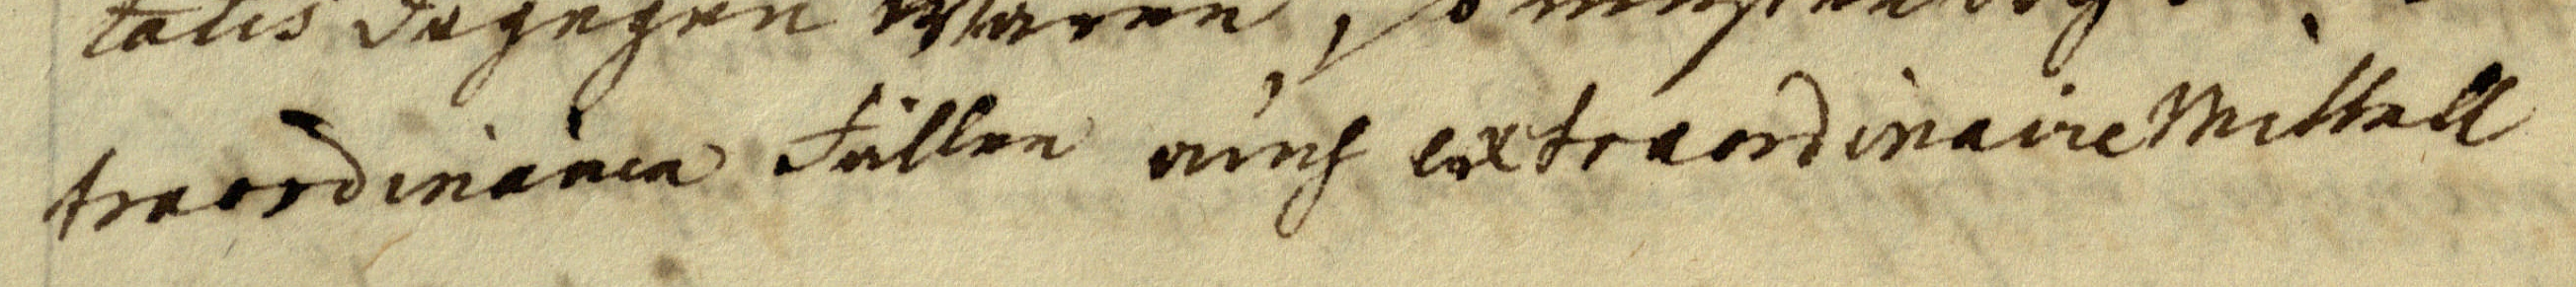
traordinären Fällen auch extraordinaire Mittel
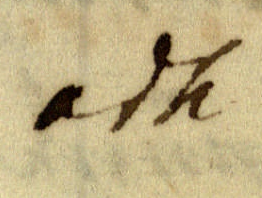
adh
